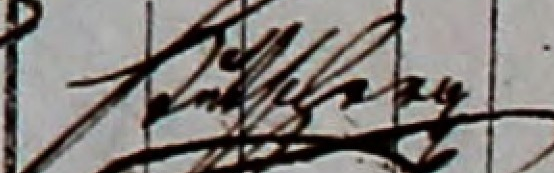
Kutscheng
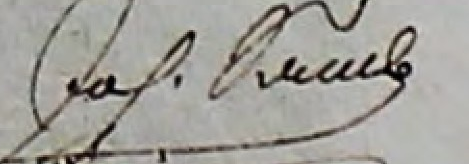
Joh. Samb
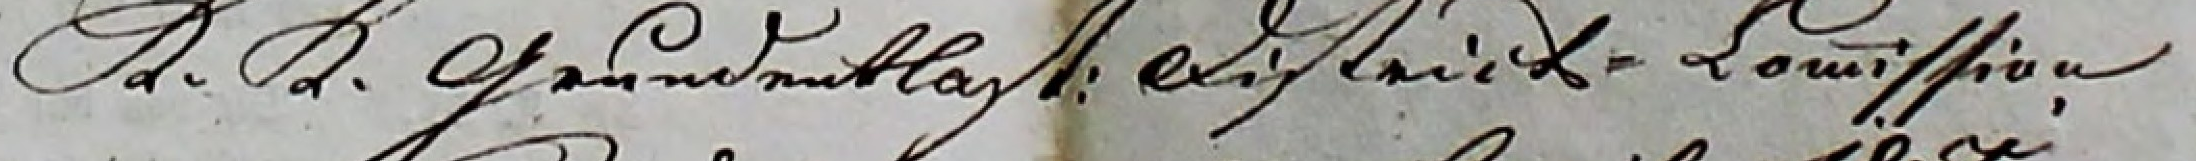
k.k. Grundentlast: District - Commission
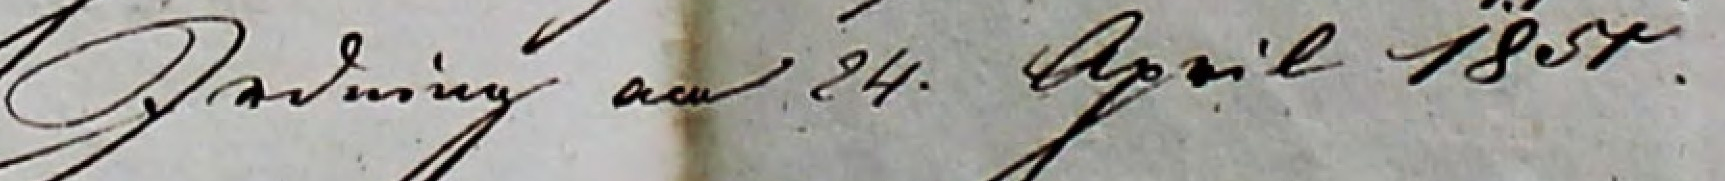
Jrdning am 24. April 1851.
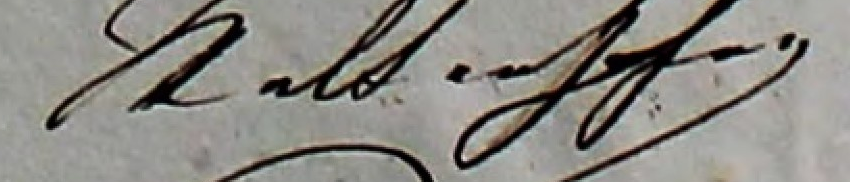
Walterscher
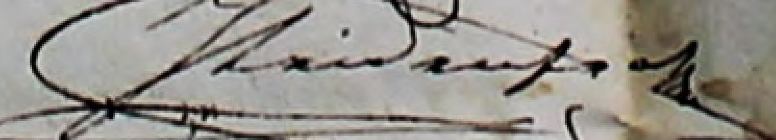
Steidens???
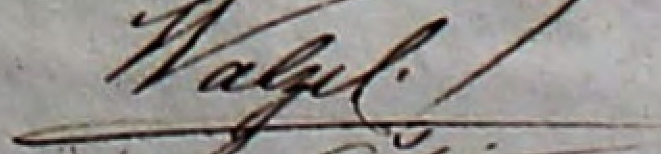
Walzel.
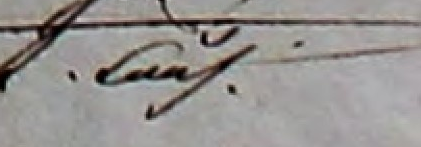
??Caus.
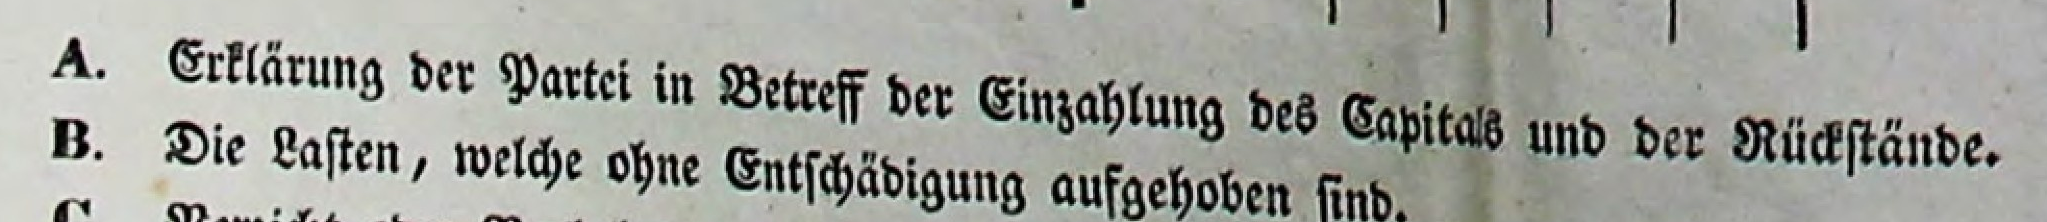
A. Erklärung der Partei in Betreff der Einzahlung des Capitals und der Rückstände=
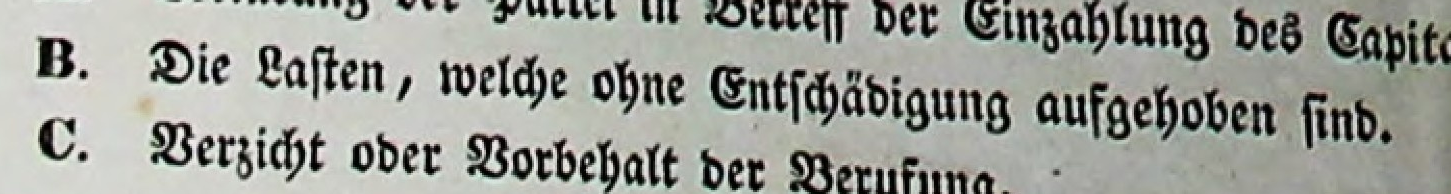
B. Die Lasten, welche ohne Entschädigung aufgehoben sind.
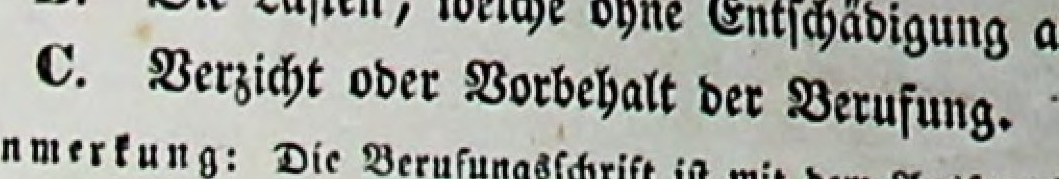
C. Verzicht oder Vorbehalt der Berufung.
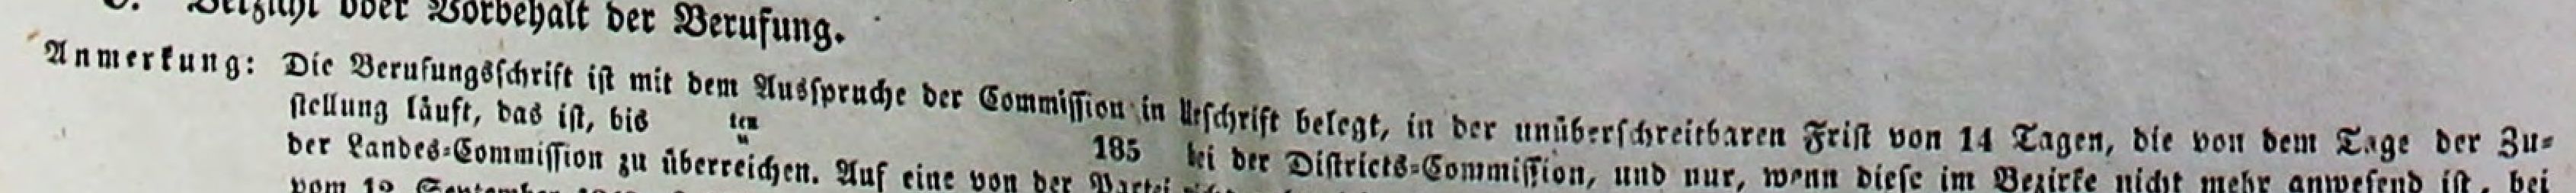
Anmerkung: ie Berufungsschrift ist mit dem Ausspruche der Commission in Urschrift belegt, in der unüberschreitbaren Frist von 14 Tagen, die von dem Tage der Zu=
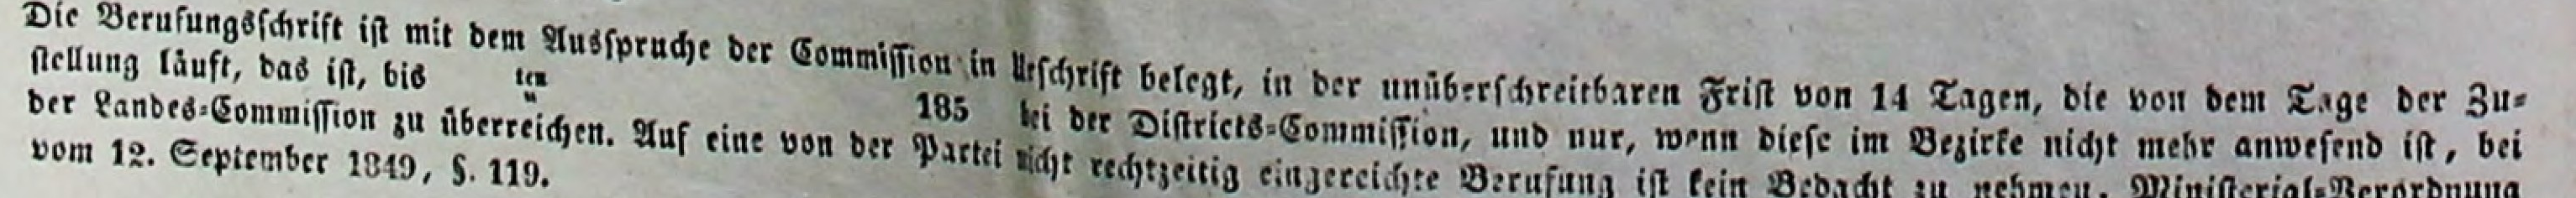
stellung läuft, das ist, bis ten 185 bei der Districts=Commission, und nur, wenn diese im Bezirke nicht mehr anwesend ist, bei
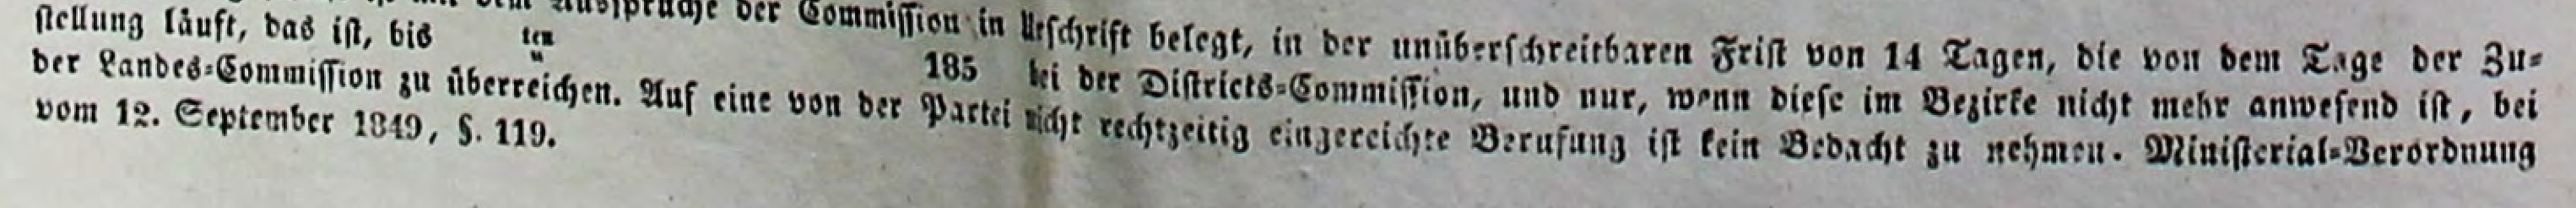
der Landes=Commission zu überrechen. Auf eine von der Partei nicht rechtzeitig eingereichte Berufung ist kein Bedacht zu nehmen. Ministerial=Verordnung
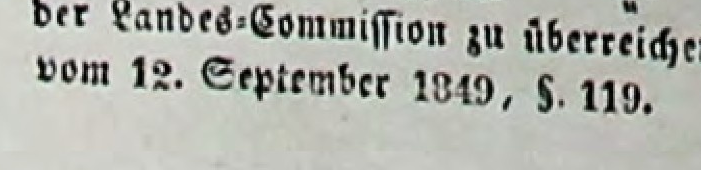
vom 12. September 1849, §. 119.
